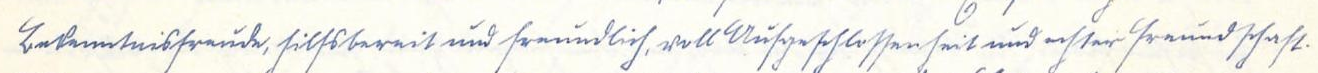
Bekenntnisfreude, hilfsbereit und freundlich, voll Aufgeschlossenheit und echter Freundschaft.
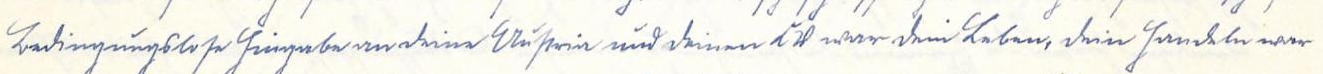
Bedingungslose Hingabe an deine Austria und deinen CV war dein Leben, dein Handeln war
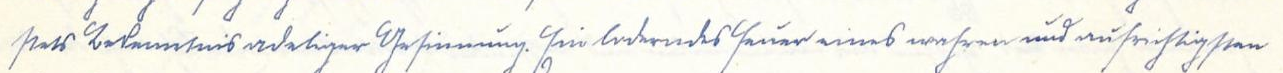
stets Bekenntnis adeliger Gesinnung. Ein loderndes Feuer eines wahren und aufrichtigen
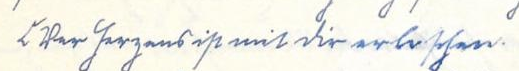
CVer Herzens ist mit dir erloschen.
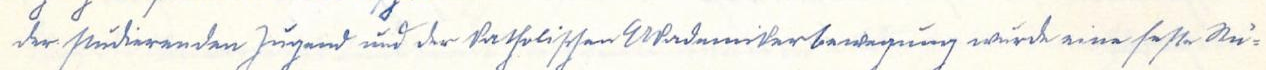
Der studierenden Jugend und der katholischen Akademikerbewegung wurde eine feste Stü-
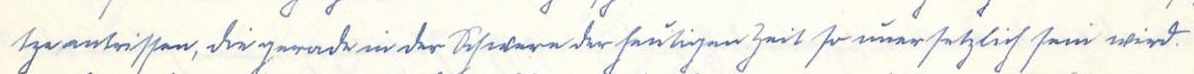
tze entrissen, die gerade in der Schwere der heutigen Zeit so unersetzlich sein wird.
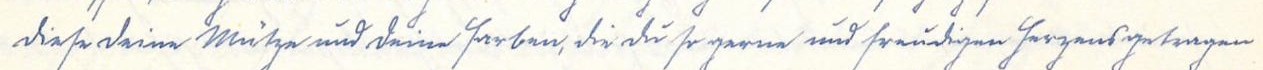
Diese deine Mütze und deine Farben, die du so gerne und freudigen Herzens getragen
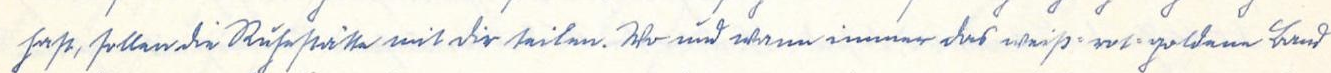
hast, sollen die Ruhestätte mit dir teilen. Wo und wann immer das weiß-rot-goldene Band
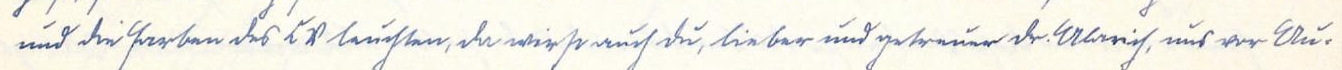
und die Farben des CV leuchten, dann wirst auch du, lieber und getreuer Dr. Alarich, Eilrich uns vor Au-
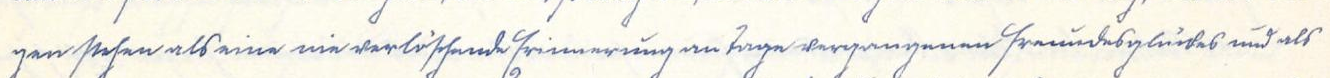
gen stehen als eine nie verlöschende Erinnerung an Tage vergangenen Freundesglückes und als
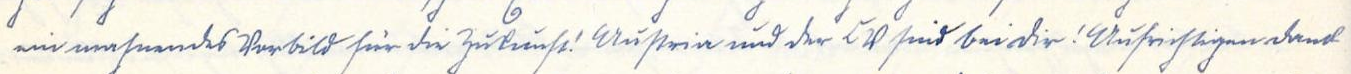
ein mahnendes Vorbild für die Zukunft! Austria und der CV sind bei dir! Aufrichtigen Dank
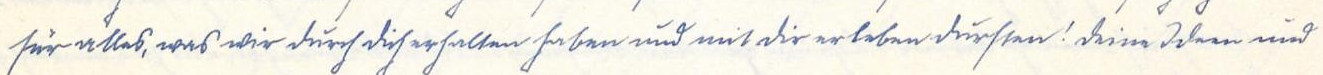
für alles, was wir durch dich erhalten haben und mit dir erleben durften! Deine Ideen und deine Arbeit
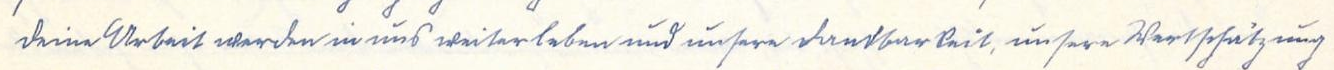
werden in uns weiterleben und unsere Dankbarkeit, unsere Wertschätzung
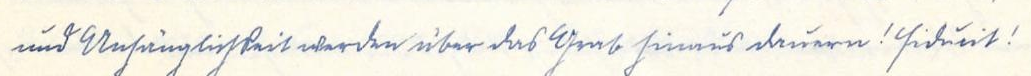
und Anhänglichkeit werden über das Grab hinaus dauern! Fiducit!
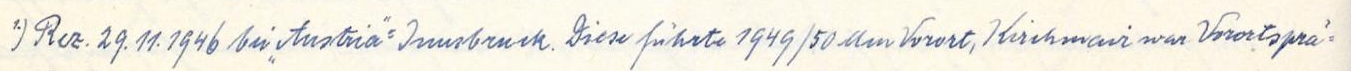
1) Rez. 29.11.1946 bei „Austria“ Innsbruck. Diese führte 1949/50 den Vorort, Kirchmair war Vorortsprä-
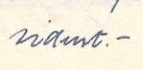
sident.-
